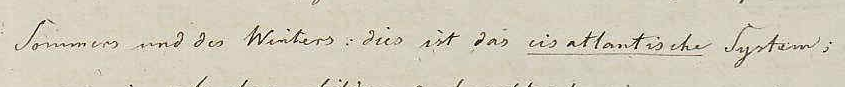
Sommers und des Winters: dies ist das cisatlantische System;
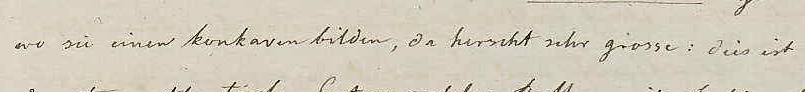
wo sie einen konkaven bilden, da herscht sehr grosse: dies ist
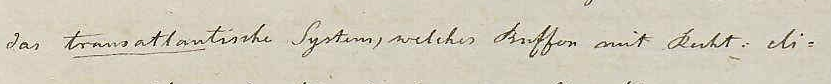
das transatlantische System, welches Buffon mit Recht: cli-
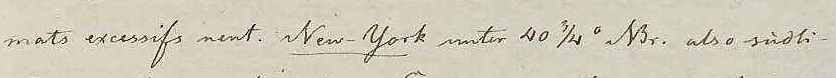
mats excessifs nent. New-York unter 40¾° Nbr. also südli-
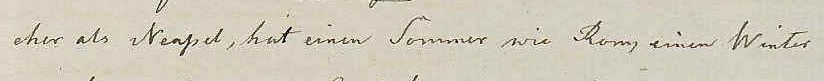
cher als Neapel, hat einen Sommer wie Rom, einen Winter
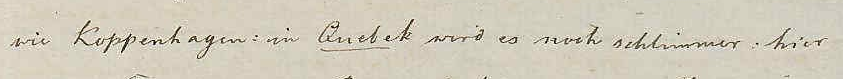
wie Koppenhagen: in Quebek wird es noch schlimmer: hier
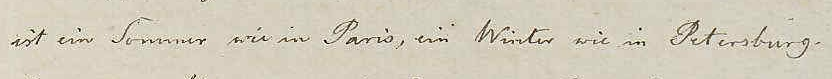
ist ein Sommer wie in Paris, ein Winter wie in Petersburg.
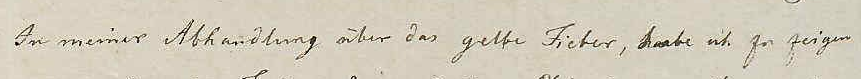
In meiner Abhandlung über das gelbe Fieber, habe ich zu zeigen
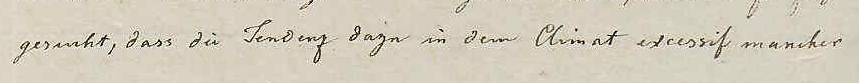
gesucht, dass die Tendenz dazu in dem Climat excessif mancher
